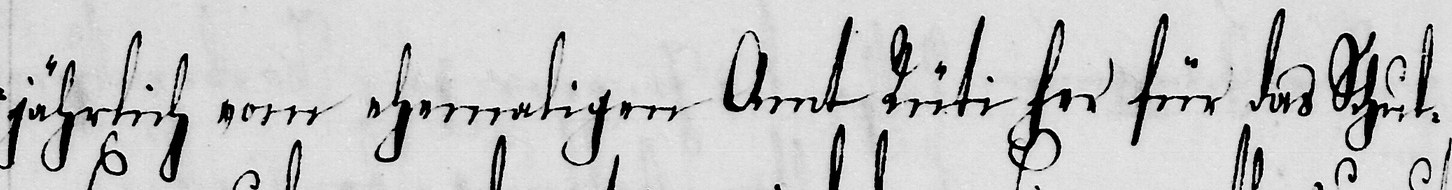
jährlich vom ehemaligen Amt Rüti her für das Schul¬
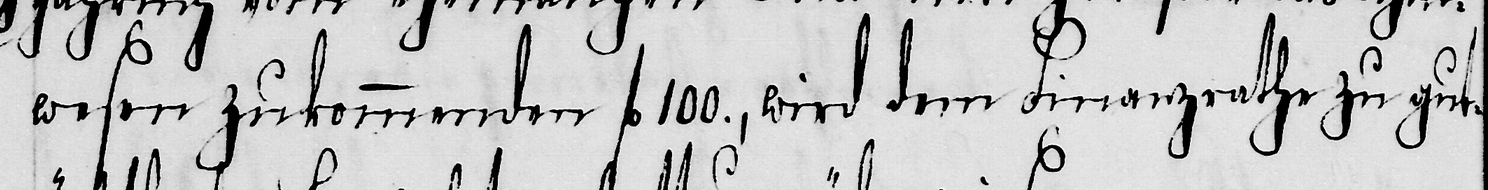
wesen zukommenden fl. 100., wird dem Finanzrathe zu gut¬
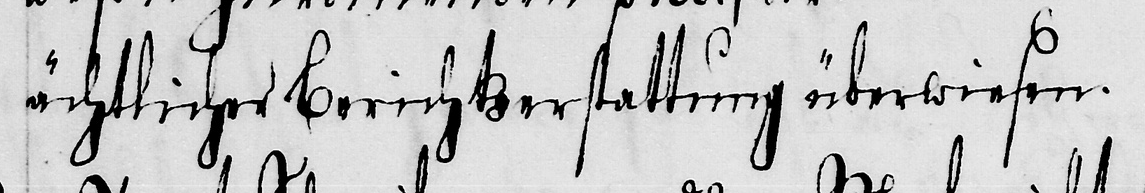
ächtlicher Berichtserstattung überwiesen.
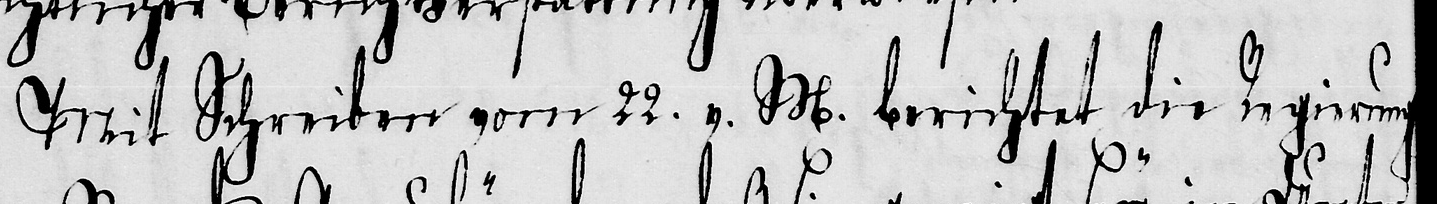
Mit Schreiben vom 22. v. M. berichtet die Regierung
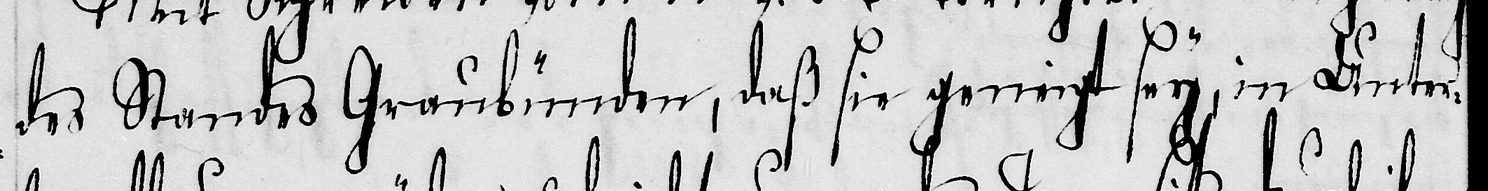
des Standes Graubünden, daß sie geneigt sey, in Unter¬
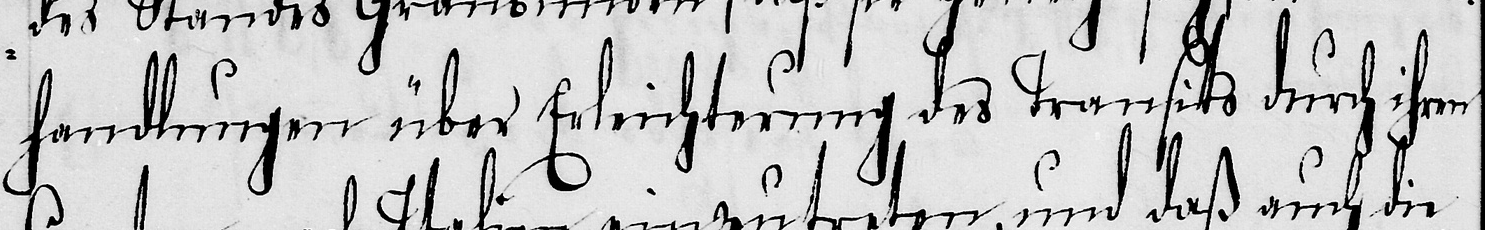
handlungen über Erleichterung des Transits durch ihr¬
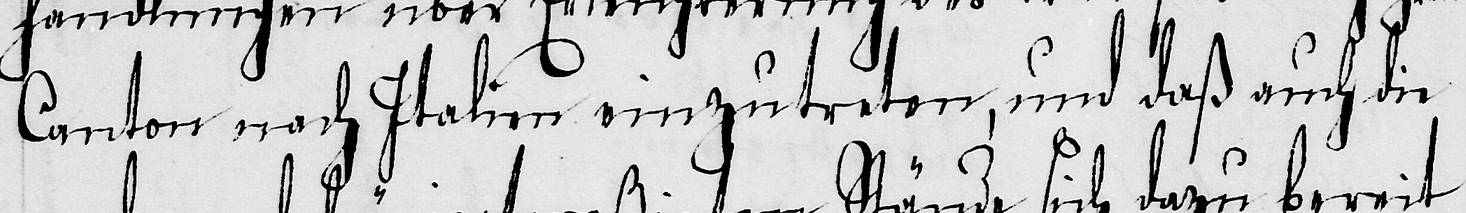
Canton nach Italien einzutreten, und daß auch die
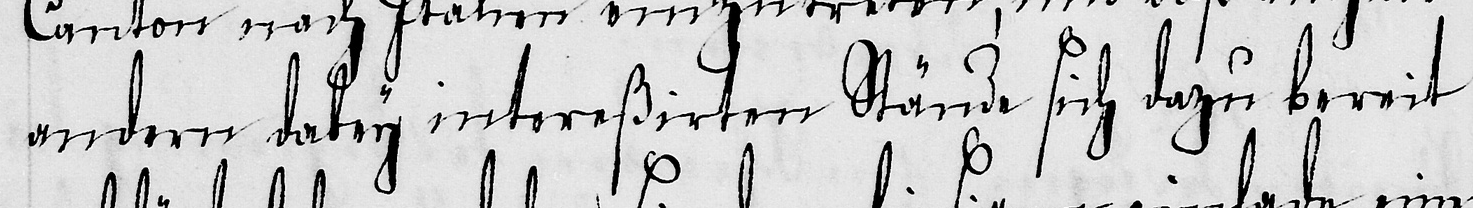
andern dabey intereßirten Stände sich dazu bereit
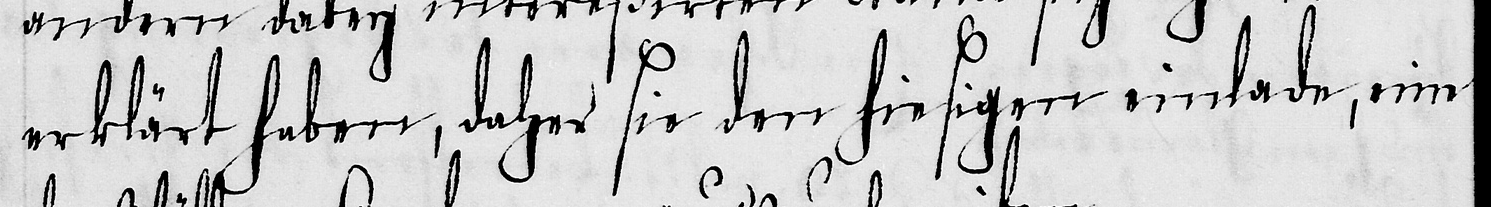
erklärt haben, daher sie den hiesigen einlade, eine
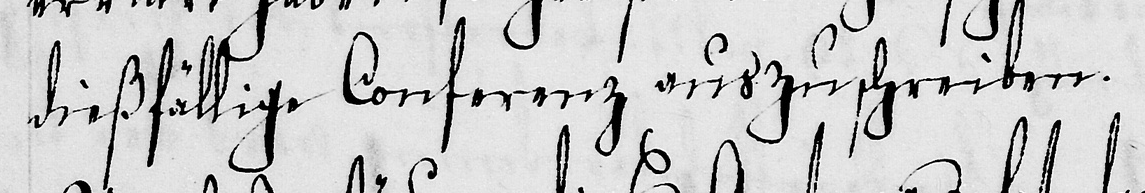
dießfällige Conferenz auszuschreiben.
